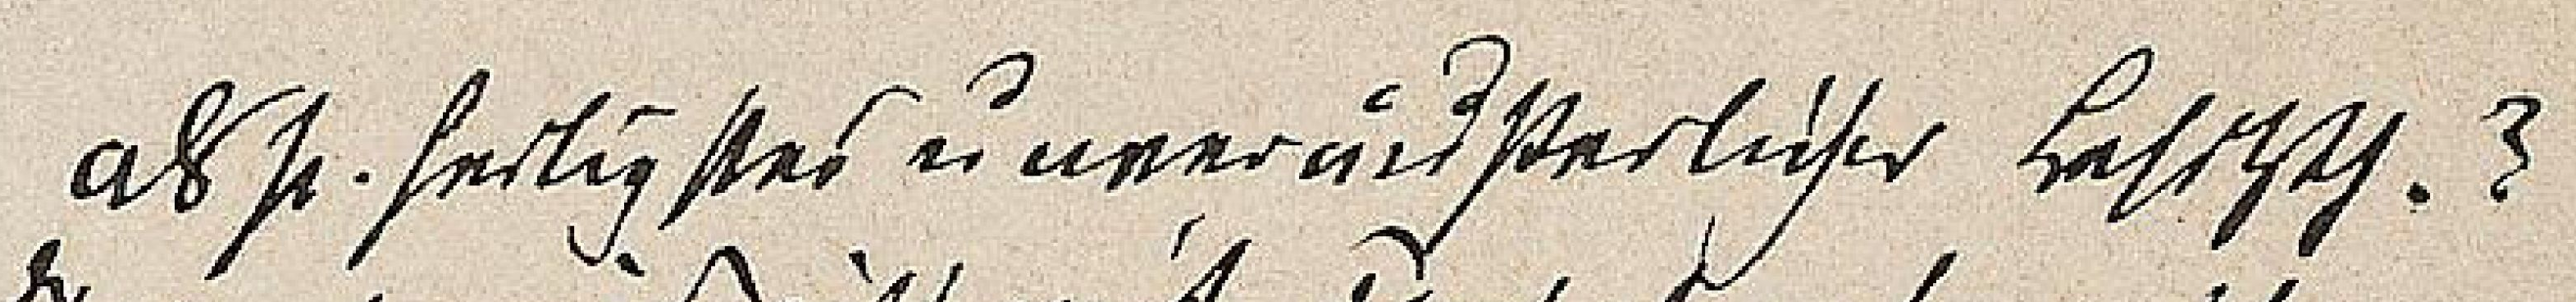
als s. heiligstes unveräußerliches Besitzth.?
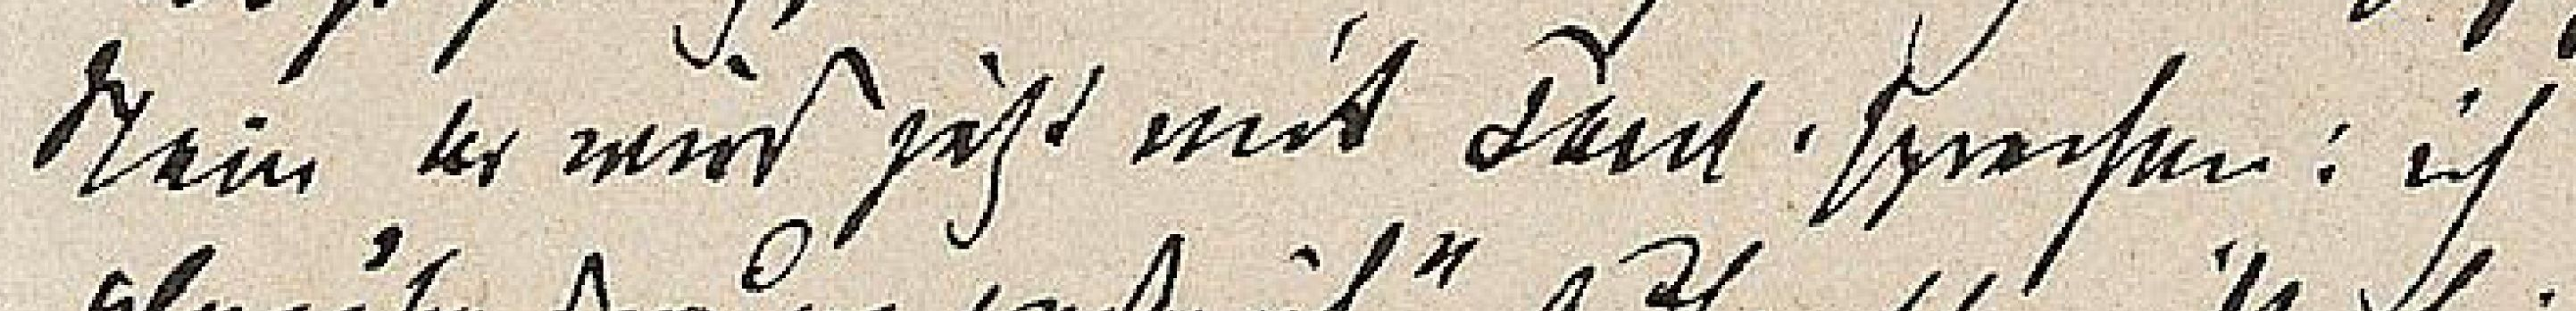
Nein er wird jetzt mit Paul. sprechen: ich
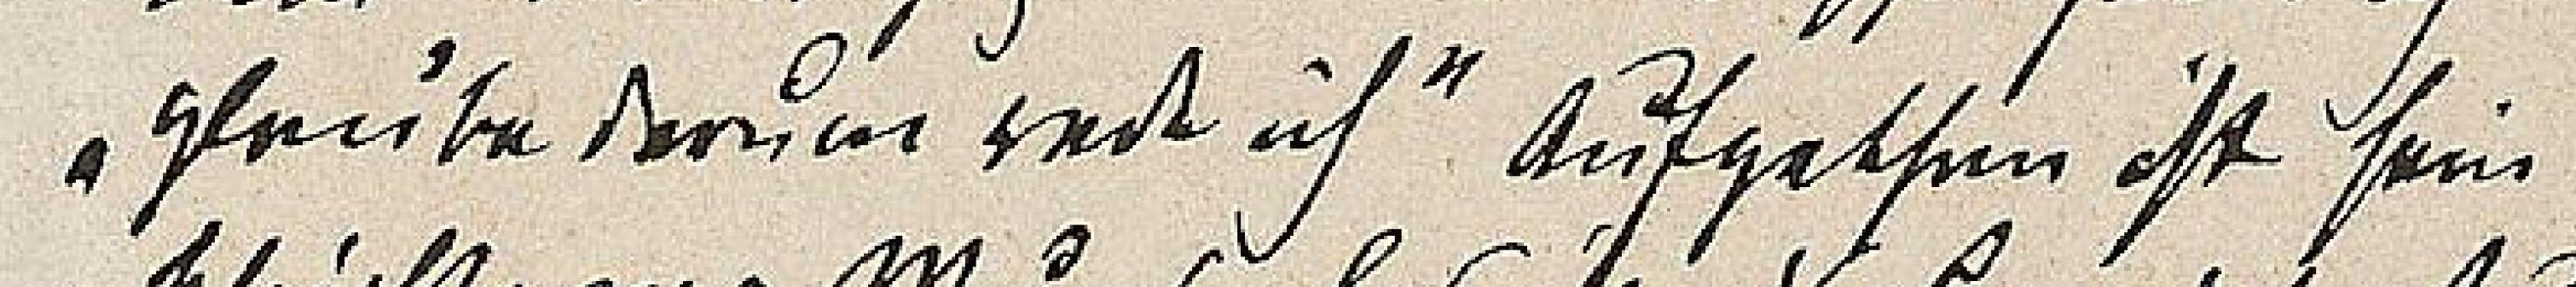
"glaube darum rede ich" Aufgethan ist sein
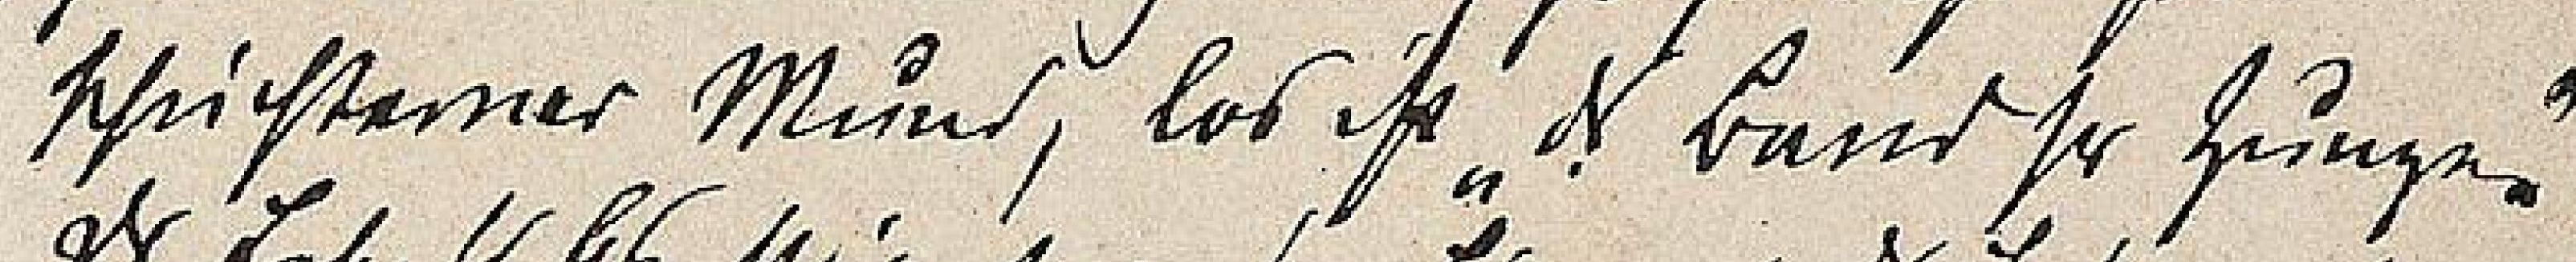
schüchterner Mund, los ist ds band sr Zunge"
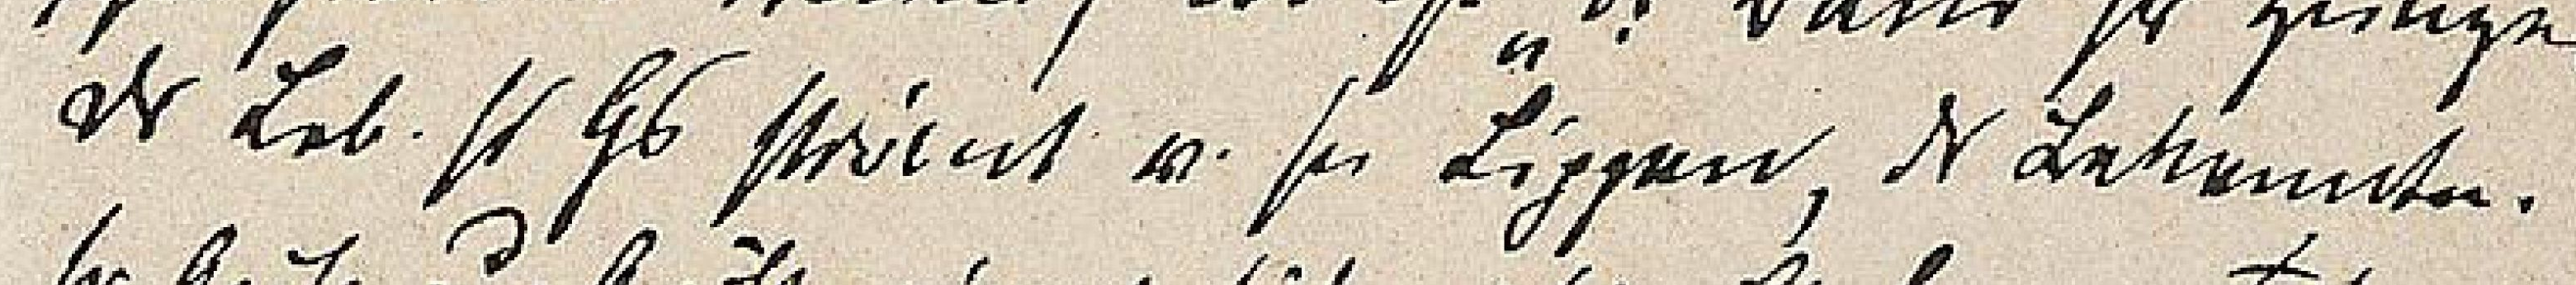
ds Lob ss Gs strömt v sn Lippen, ds Bekannte
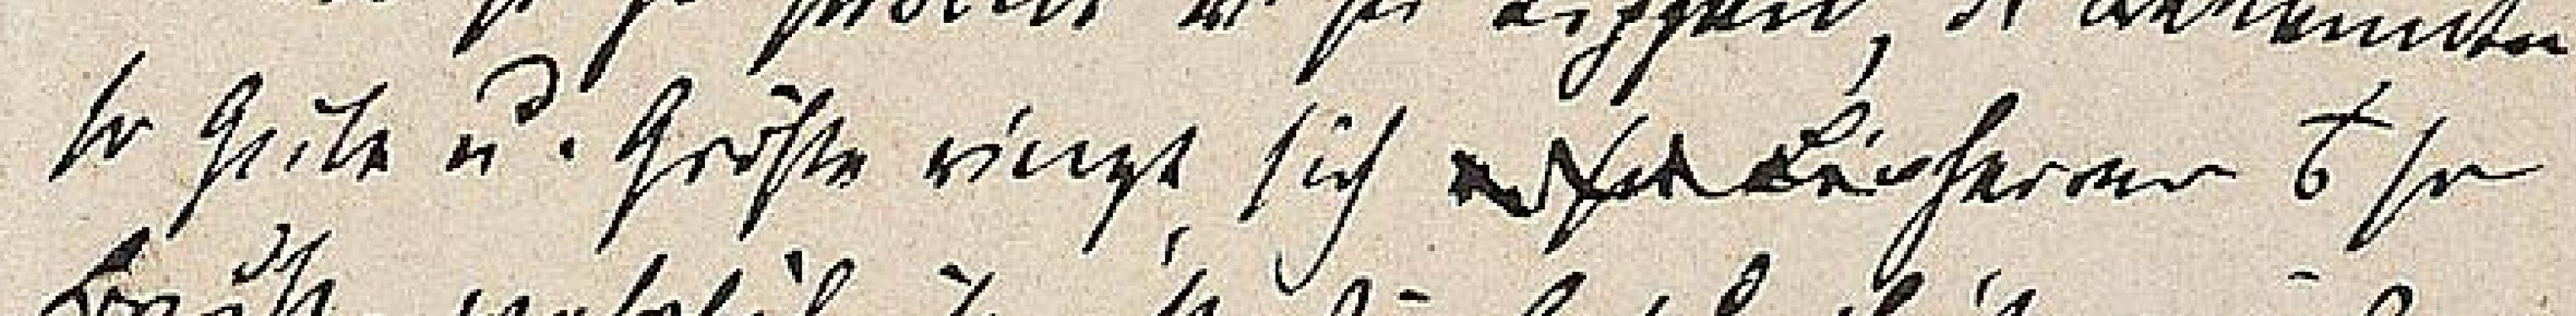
so Güte u. Größe ringt sich v sin Li hervor s sr
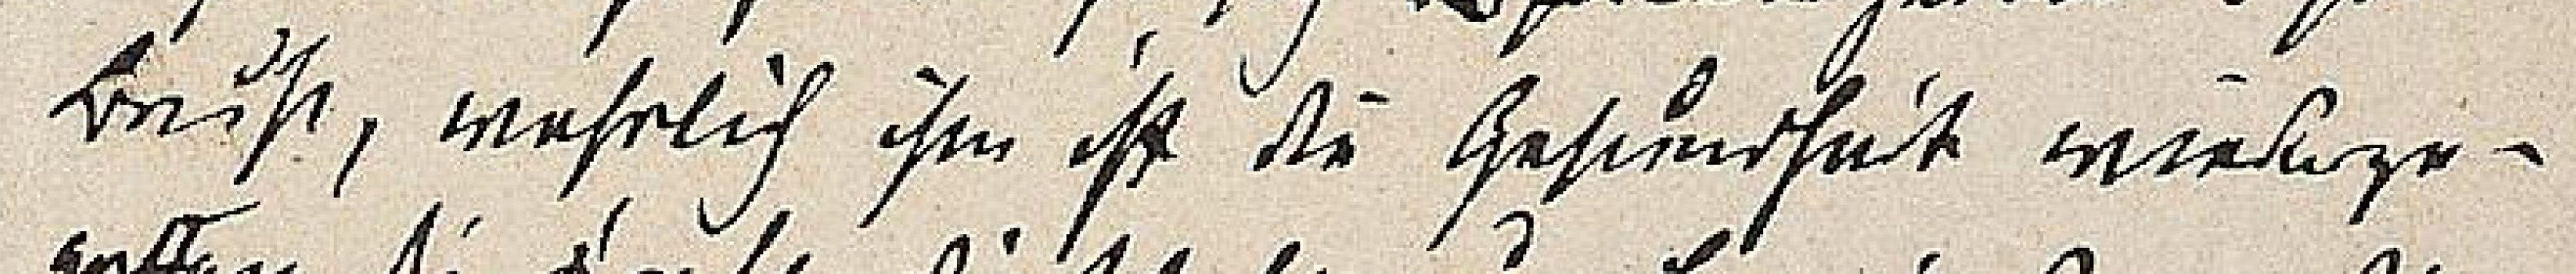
Brust, wahrlich ihm ist die Gesundheit wiederge¬
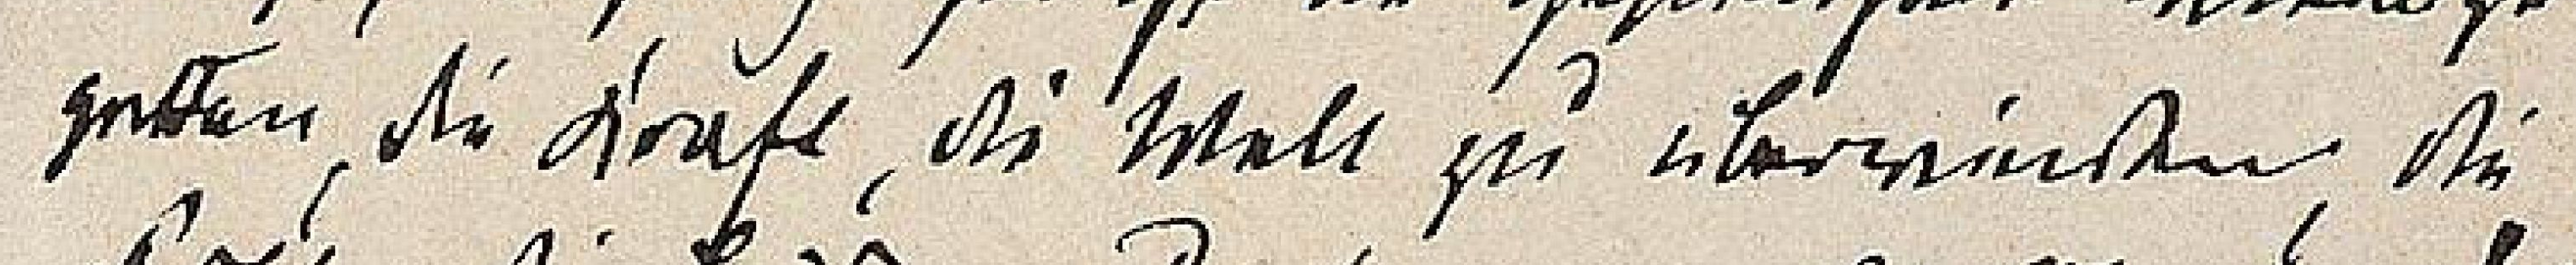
geben, die Kraft, die Welt zu überwinden, die
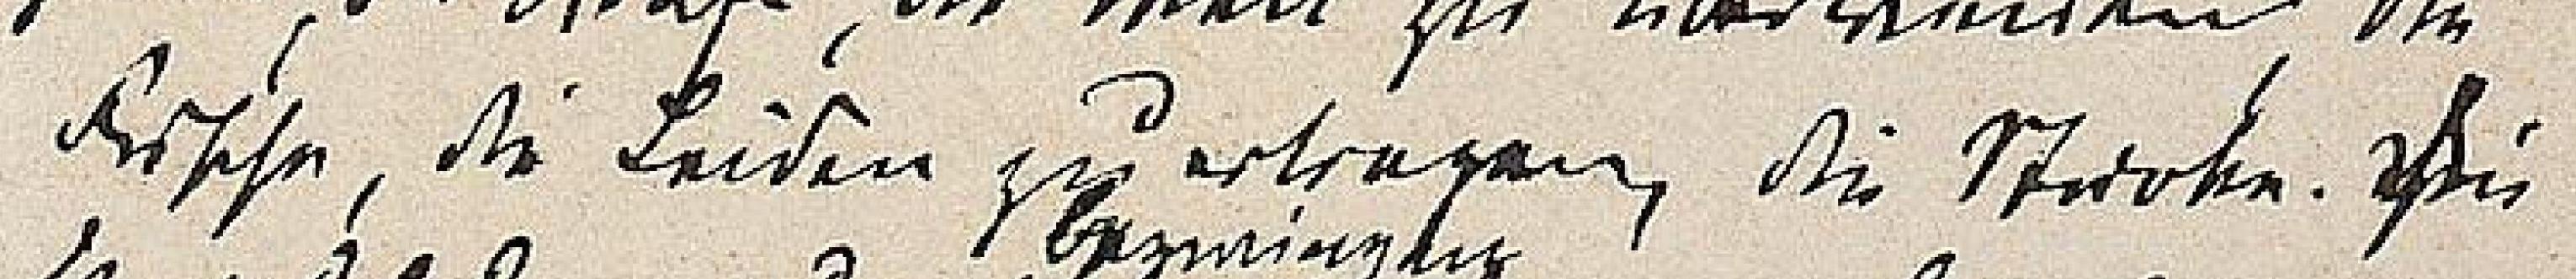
Frische, die Leiden zu. ertragen, die Stärke, die
